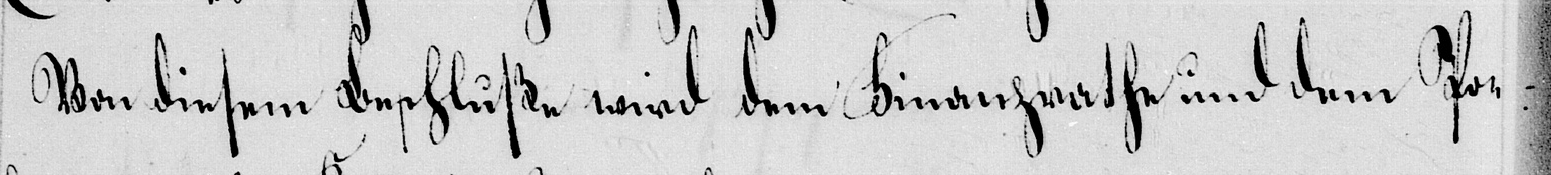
Von diesem Beschluße wird dem Finanzrathe und dem Po¬
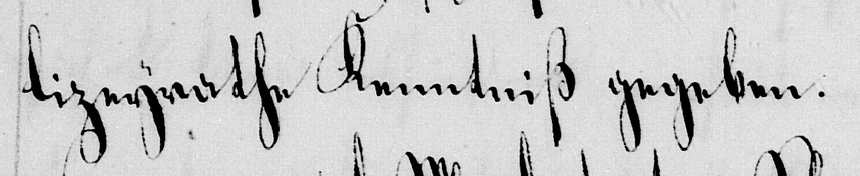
lizeyrathe Kenntniß gegeben.
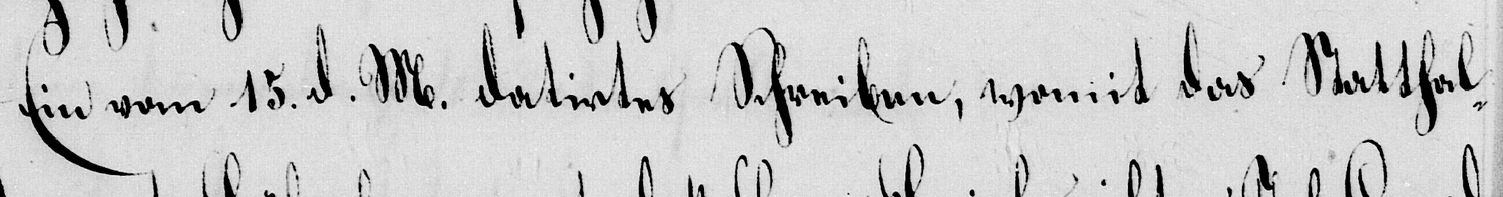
Ein vom 15. d. M. datirtes Schreiben, womit das Statthal¬
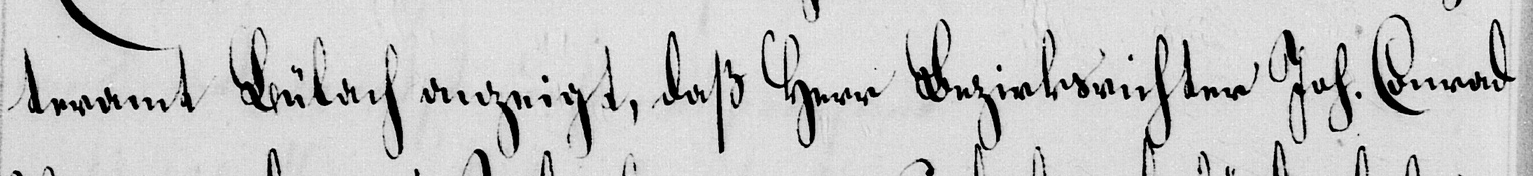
teramt Bülach anzeigt, daß Herr Bezirksrichter Joh. Conrad
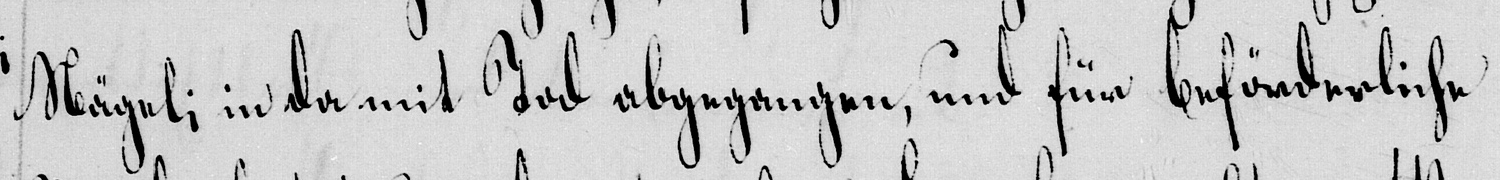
Nägeli in da mit Tod abgegangen, und für beförderliche
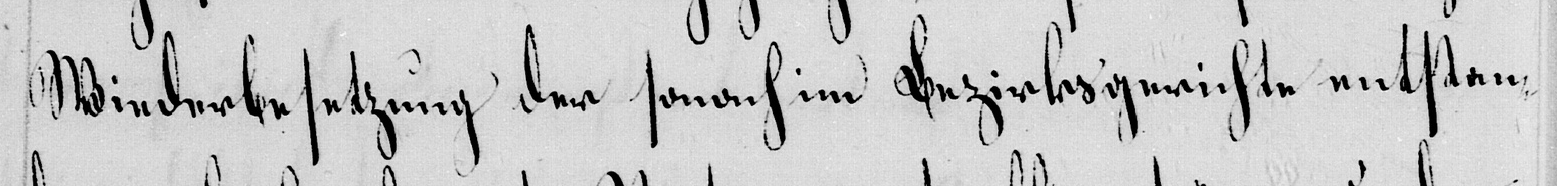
Wiederbesetzung der sonach im Bezirksgerichte entstan¬
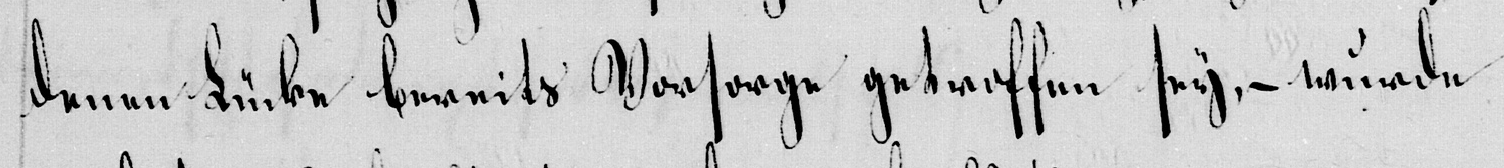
denen Lücke bereits Vorsorge getroffen sey, – wurde
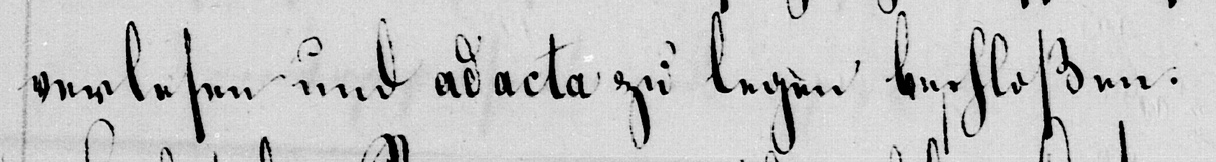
verlesen und ad acta zu legen beschloßen.
